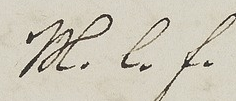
M. l. F.
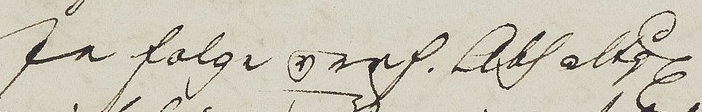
In Folge versch. Abhaltungen
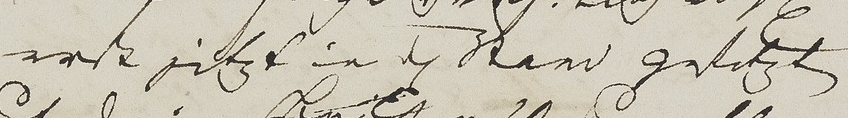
erst jetzt in den Stand gesetzt,
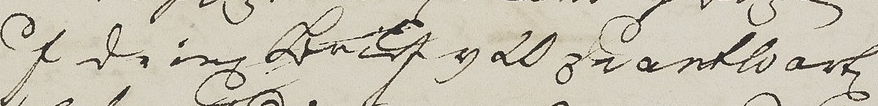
auf Deinen Brief v 20 zu antworten
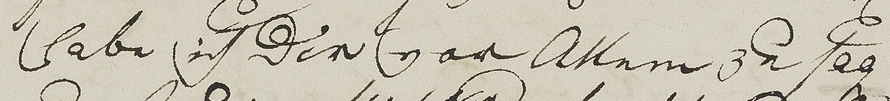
habe ich Dir vor Allem zu sagen,
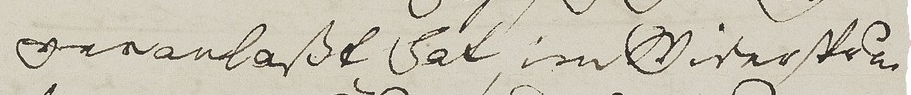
veranlaßt hat, im Widerspru-
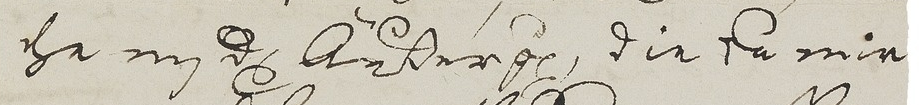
che mit den Äußerungen, die Du mir
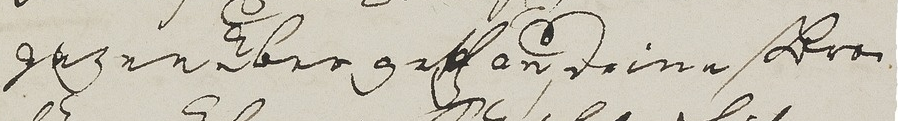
gegenüber gethan, Deine Bro-
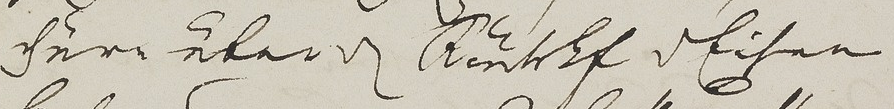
chüre über den Rückkf der Eisen-
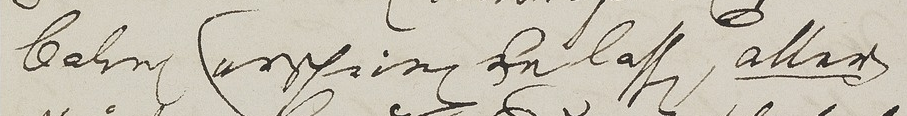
bahnen erscheinen zu lassen, aller
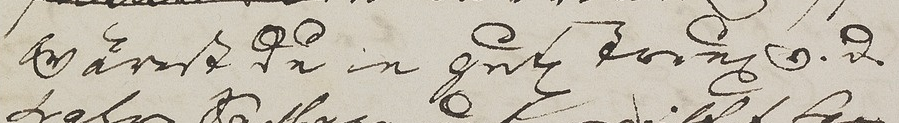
wärest Du in guten Treuen v. d.
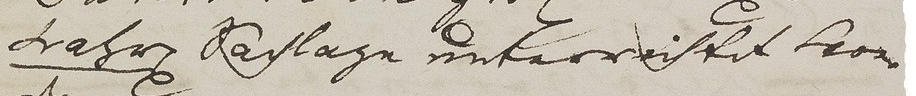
wahren Sachlage unterrichtet wor-
